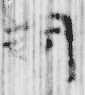司
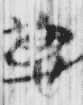惪
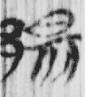{邑昜}（陽）
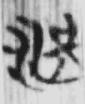湛
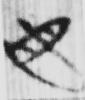母
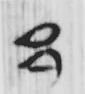邑
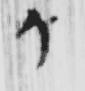人
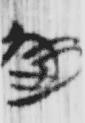○（屈）
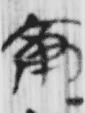○（就）
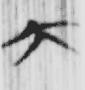大
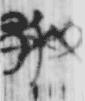○（梁）
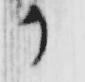人
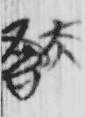○（胡）
